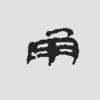雨
